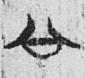公
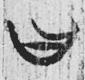曰
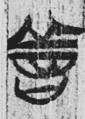善
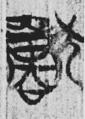○（守）
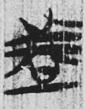者
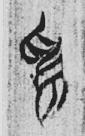奚
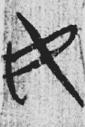女（如）
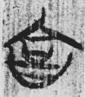合
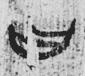曰
